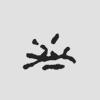至
